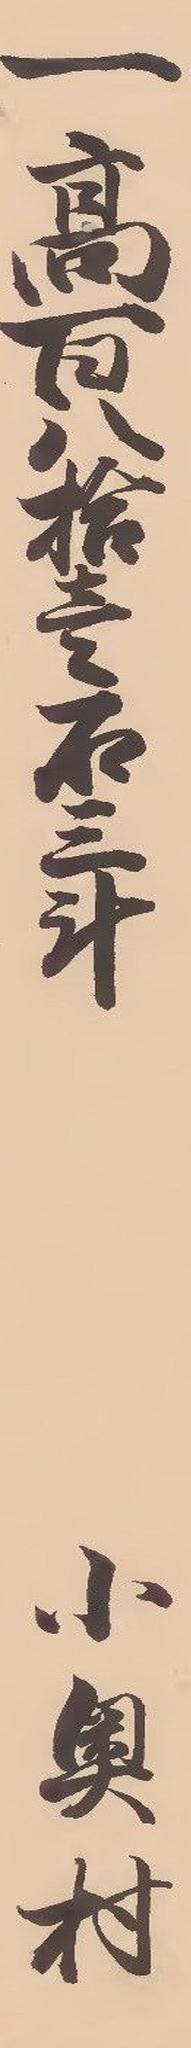一高百八拾壱石三斗小奥村

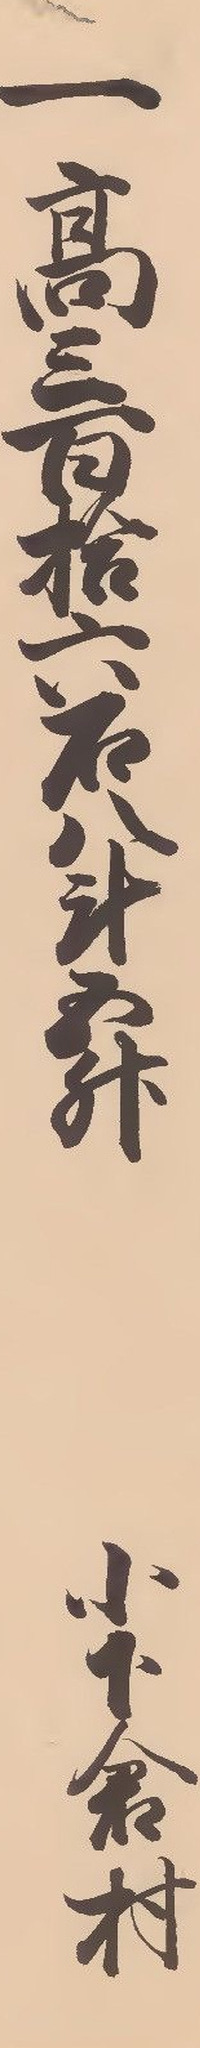一高三百拾六石八斗五升小下倉村
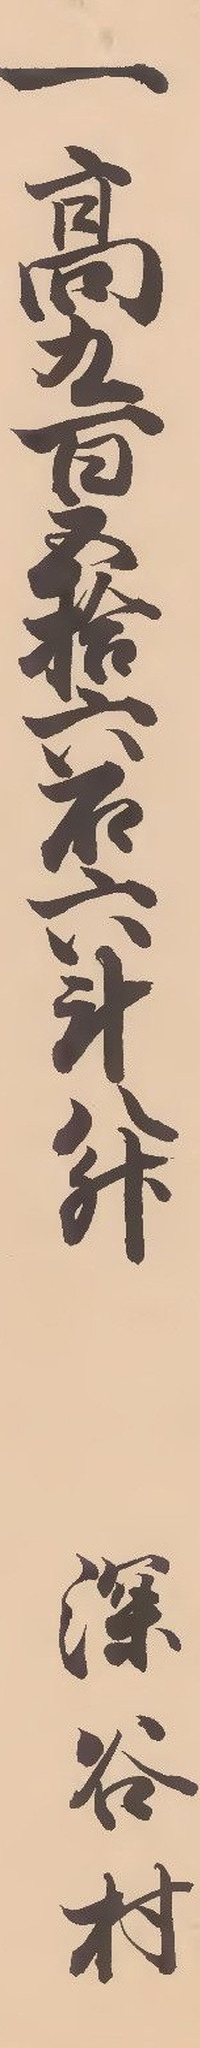一高九百五拾六石六斗八升深谷村
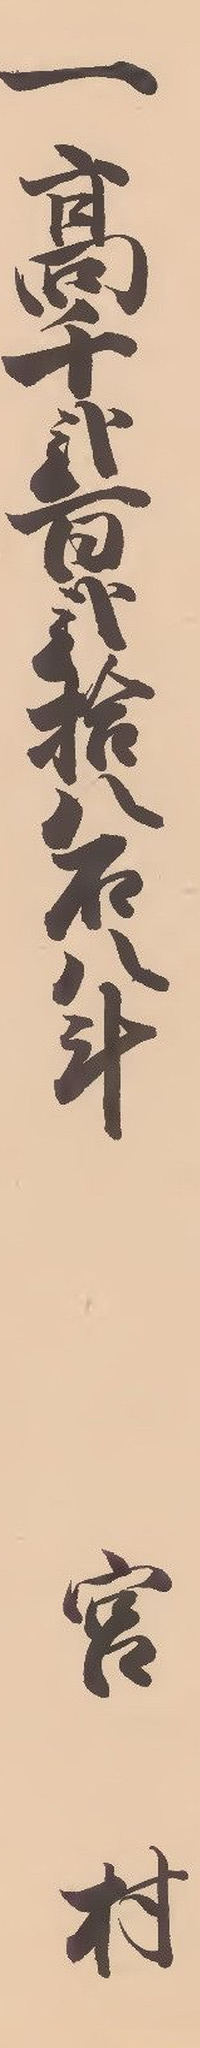一高千弐百弐拾八石八斗宮村
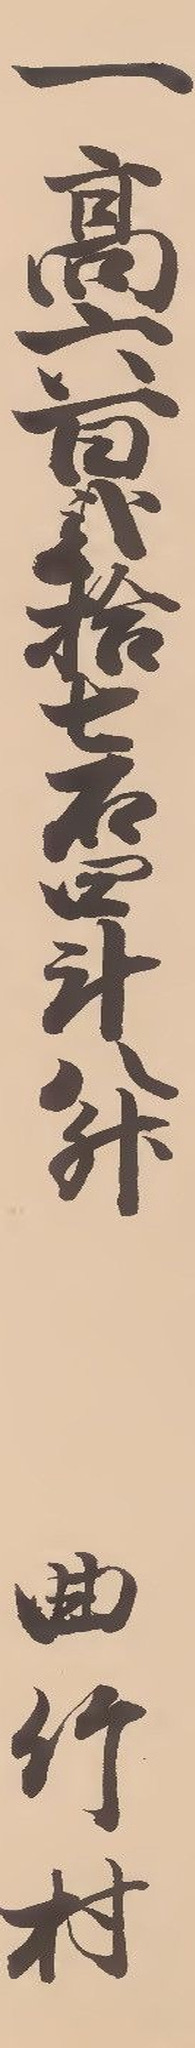一高六百弐拾七石四斗八升曲竹村
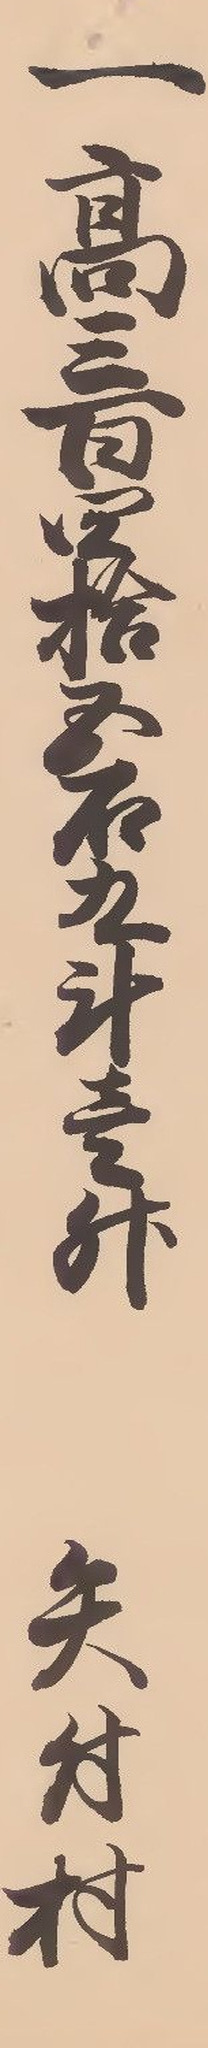一高三百四拾五石九斗壱升矢付村
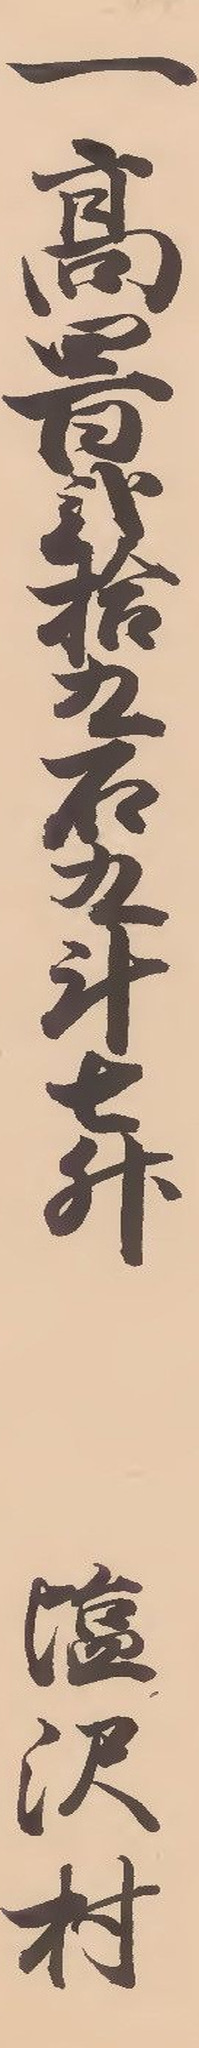一高四百弐拾九石九斗七升塩沢村
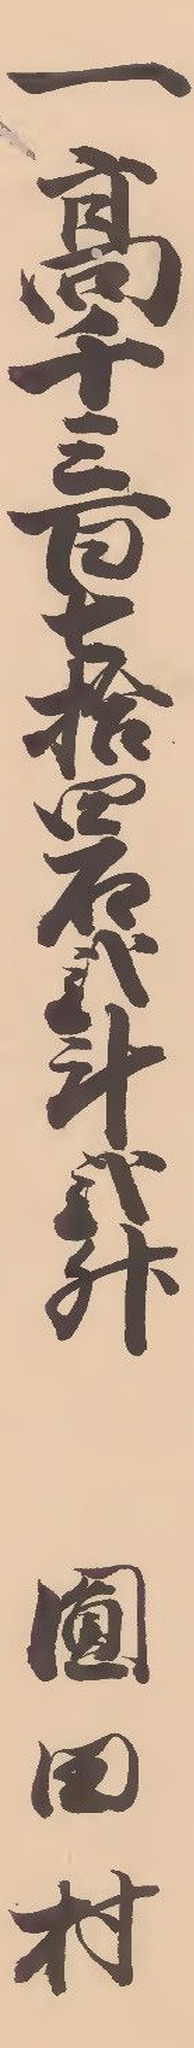一高千三百七拾四石弐斗弐升円田村

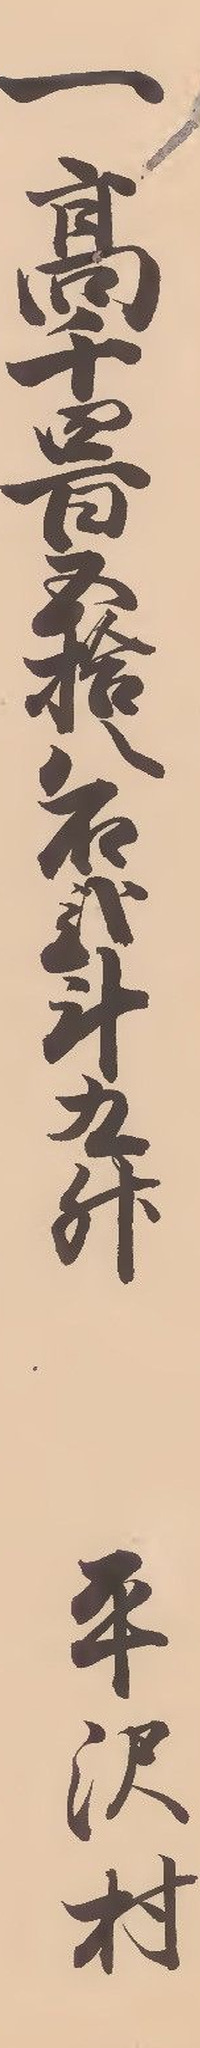一高千四百五拾八石弐斗九升平沢村
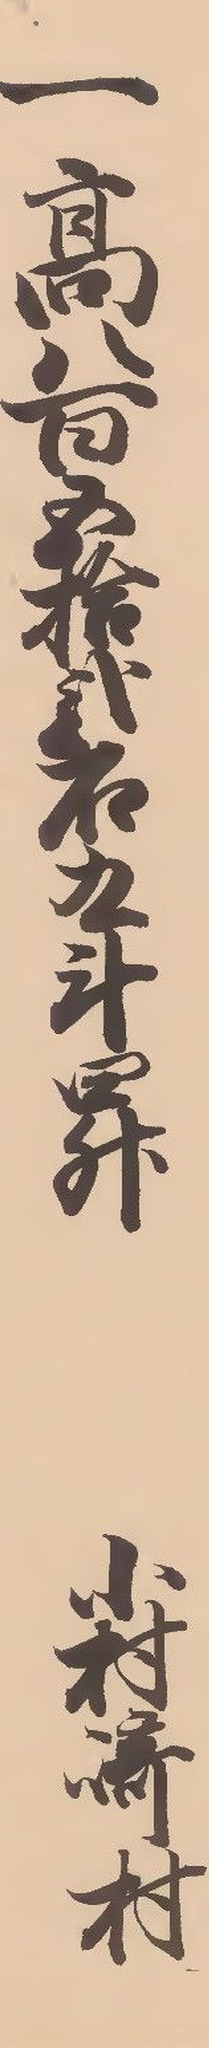一高八百五拾弐石九斗四升小村崎村
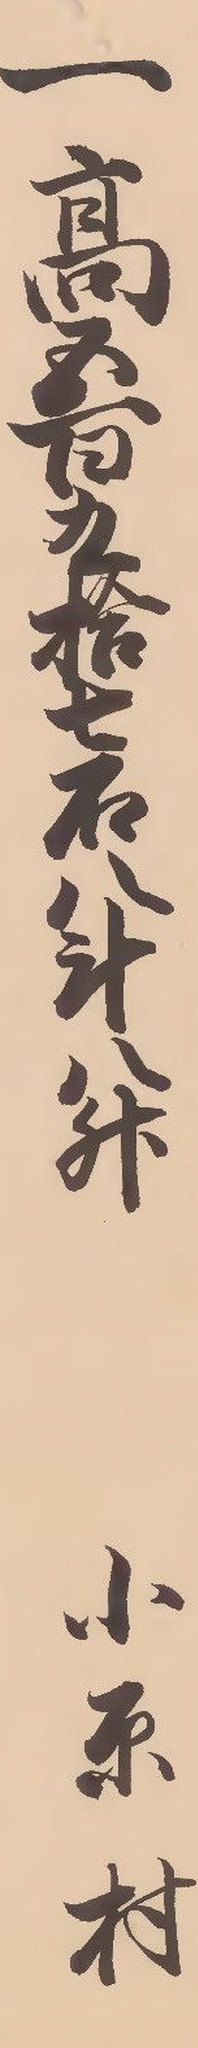一高五百九拾七石八斗八升小原村
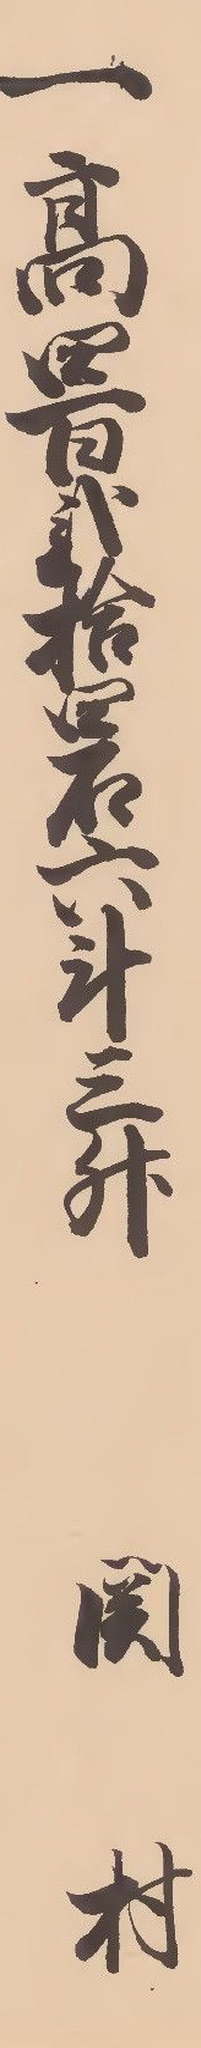一高四百弐拾四石六斗三升関村
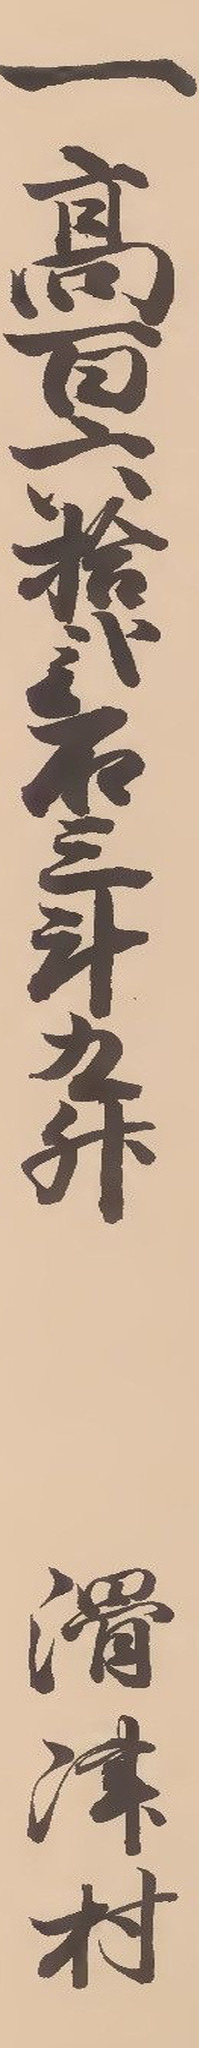一高百六拾弐石三斗九升滑津村
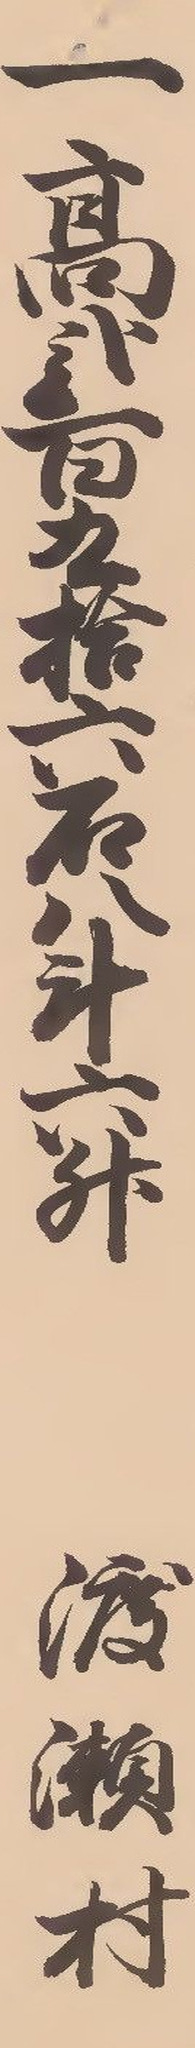一高弐百九拾六石八斗六升渡瀬村
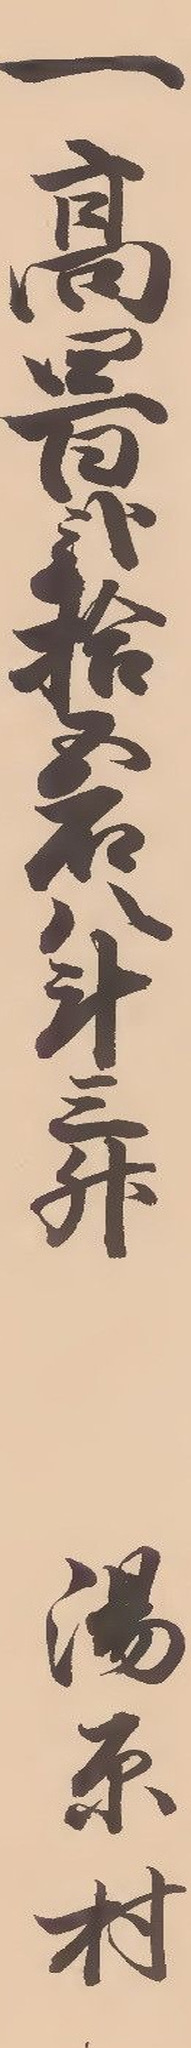一高四百弐拾五石八斗三升湯原村

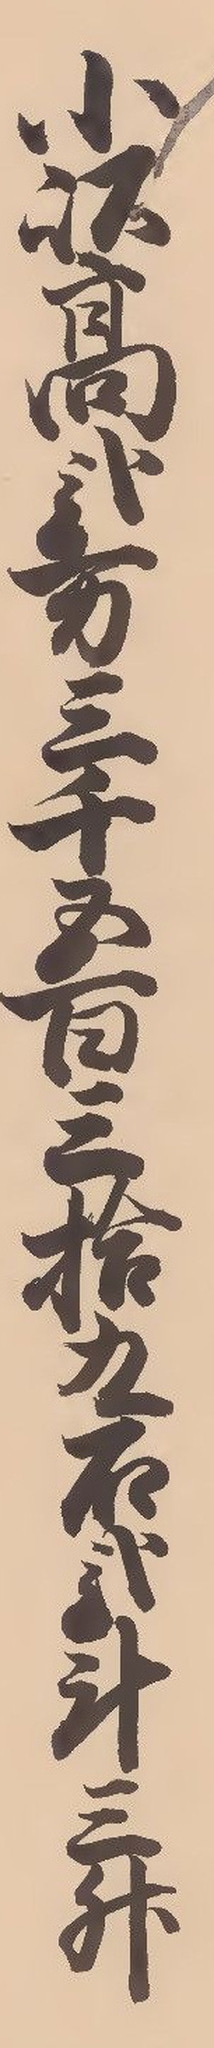小以高弐万三千五百三拾九石弐斗三升
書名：陸奥国郷帳　５
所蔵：国立公文書館 National Archives of Japan
